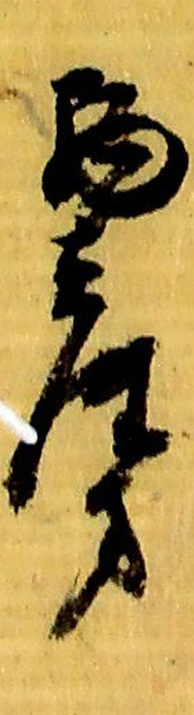物産方
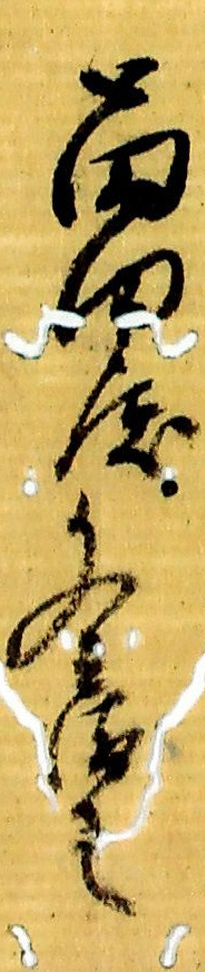富田屋久兵衛方へ

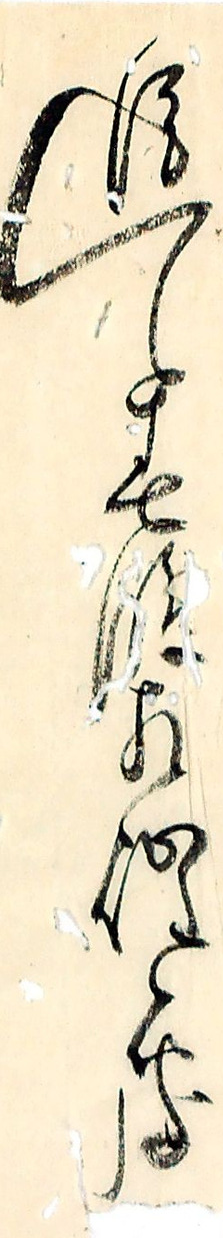追日春暖相催候処
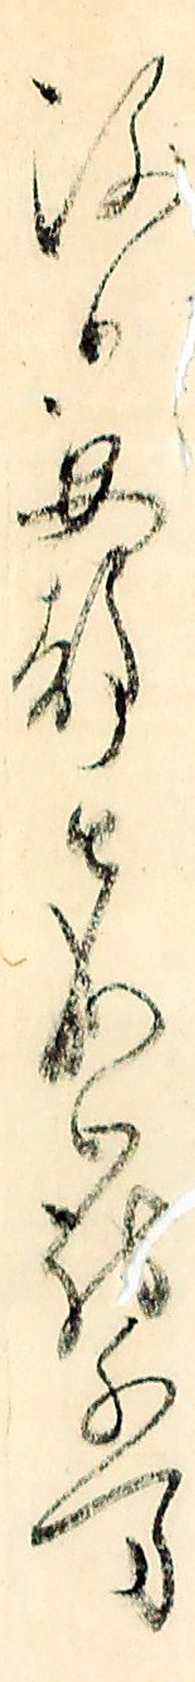弥御安静被成御座千万
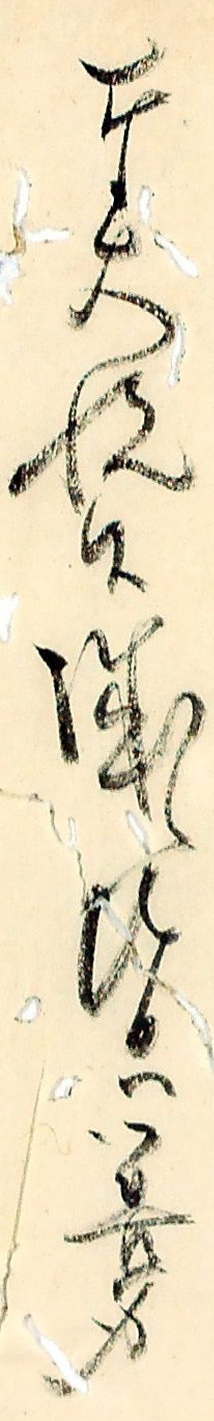奉大悦候誠に頃日は身
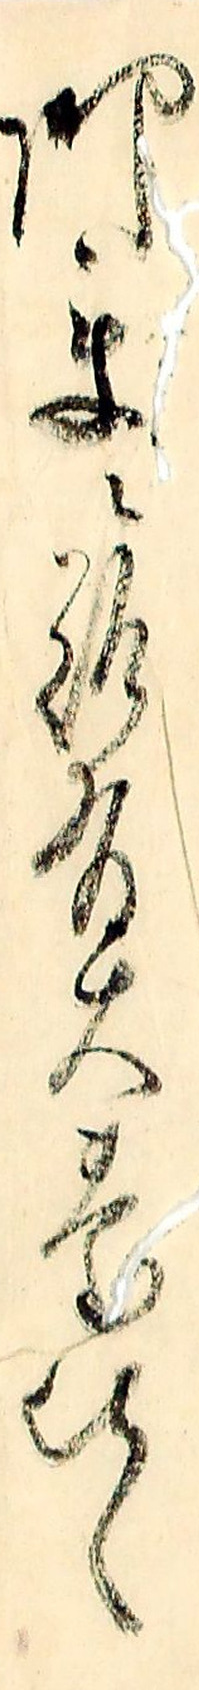御互に難有大慶仕候
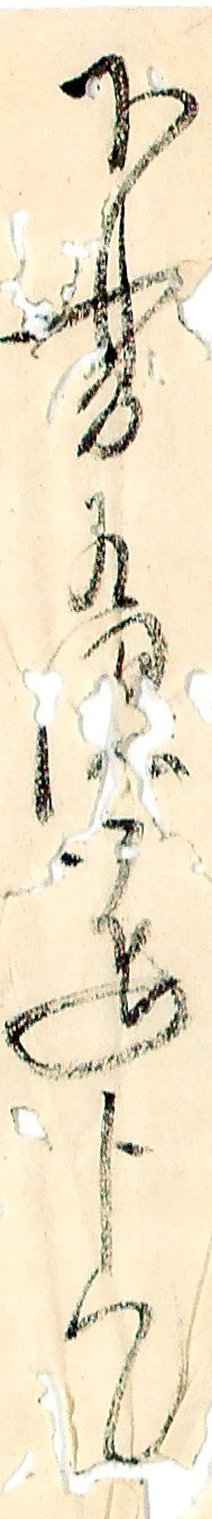下書相認御達申上候
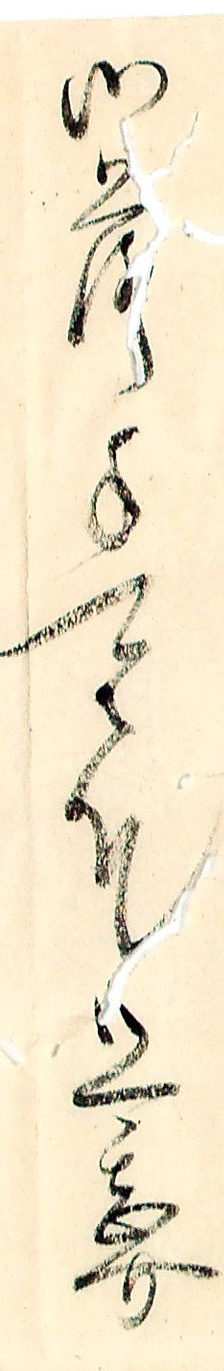御落手可被下候且甚介
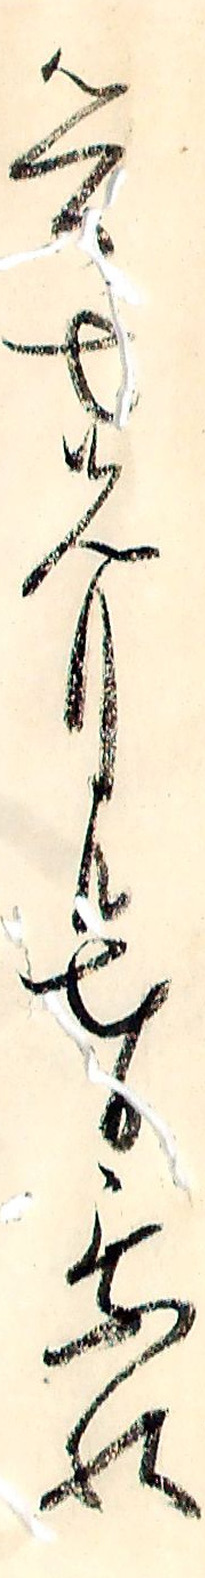兵七先月廿七日乗船

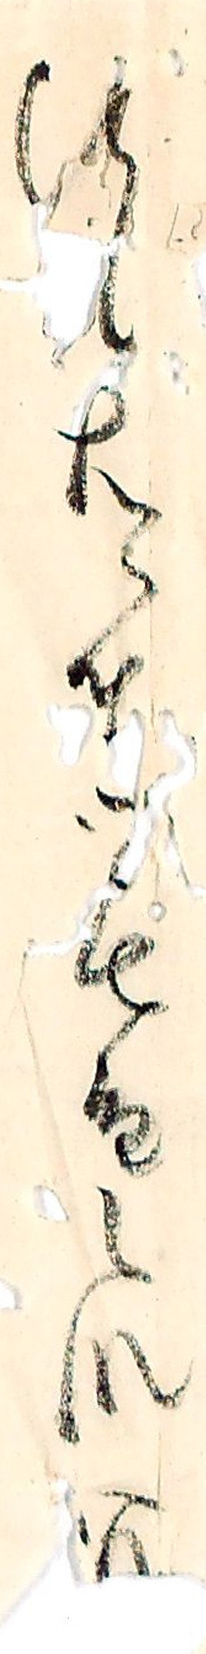仕候右に付御無念之段宜
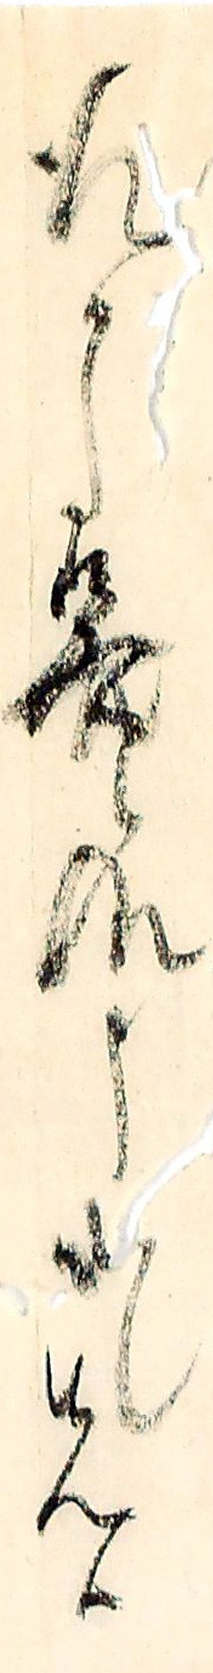得事略候様申出候先は
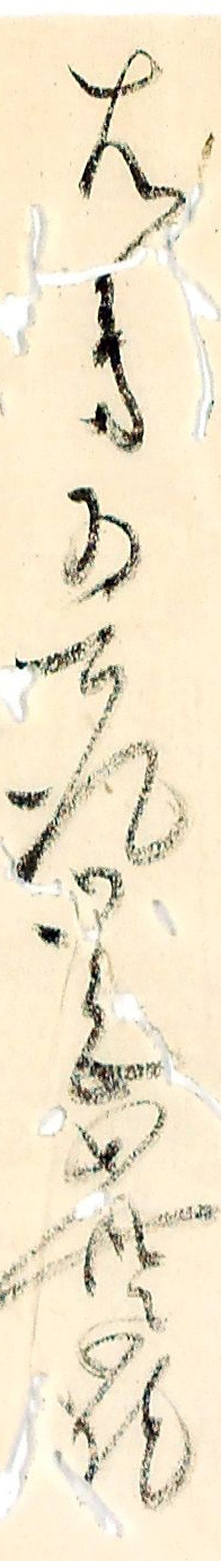右旁為可得御意如此御座候
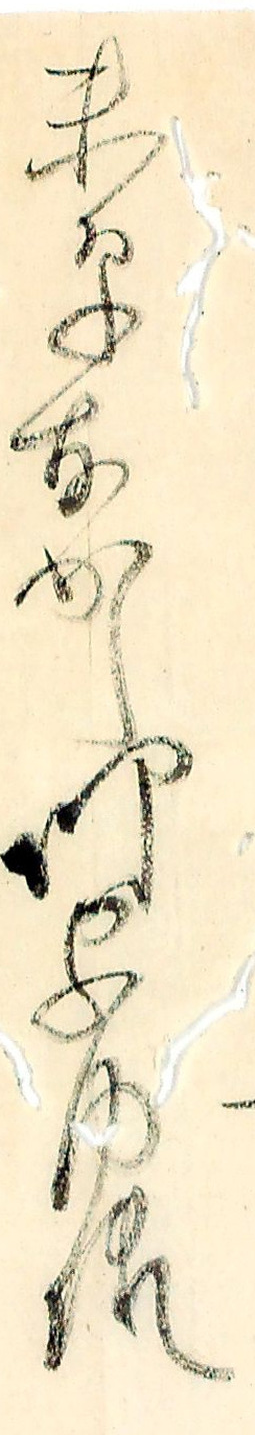末筆なから御家内様へ

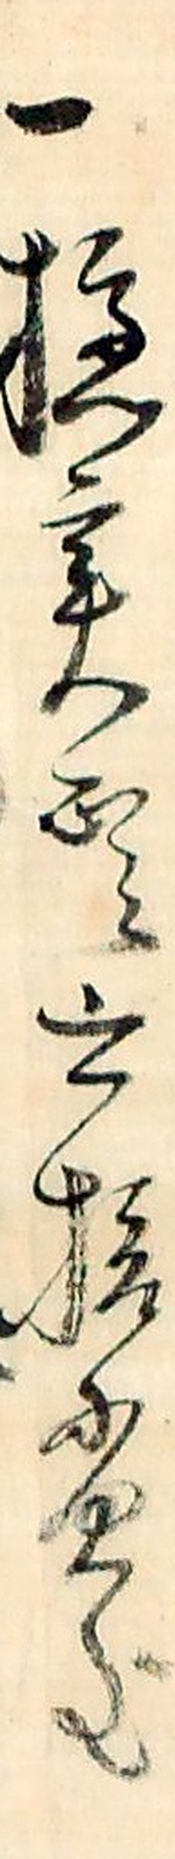一櫨実正ミ六拾貫匁
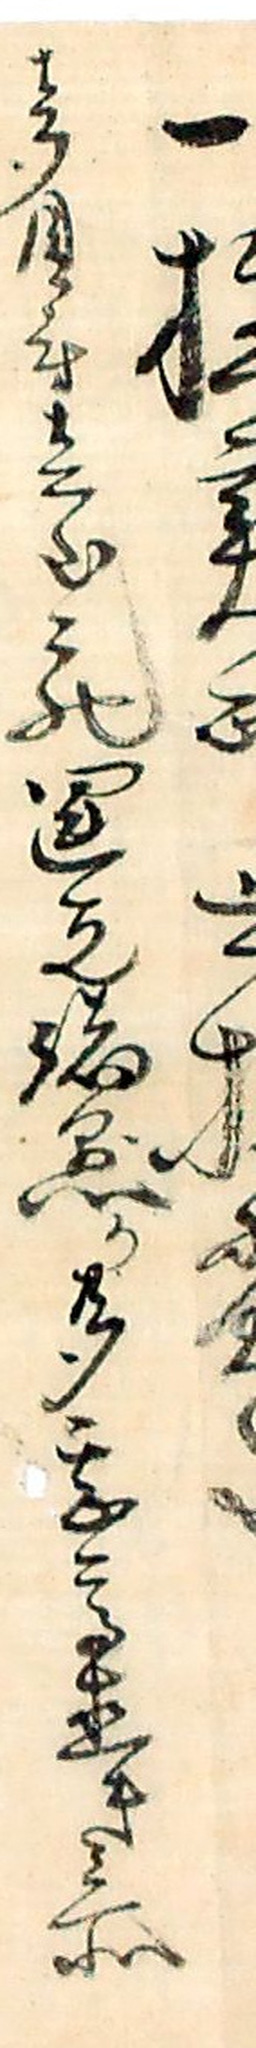壱〆目に付壱匁宛運ちん諸懸り共〆甚高直き之所
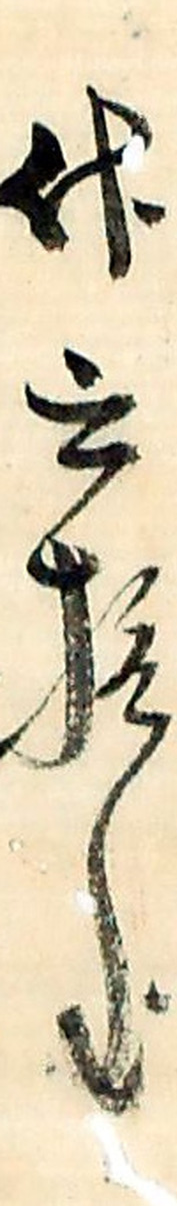代六拾匁
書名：乍恐奉願上覚（御国産櫨植付並実取集売捌等)他
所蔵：鳴門教育大学 Naruto University of Education
